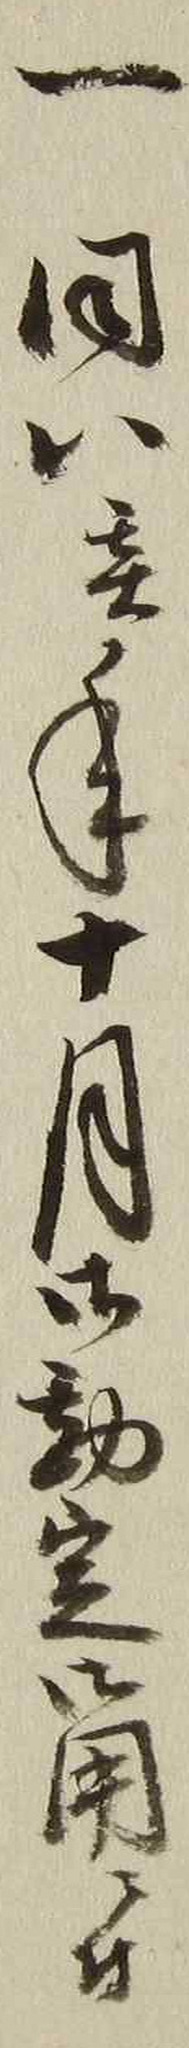一同八亥年十月御勘定御用ニ付
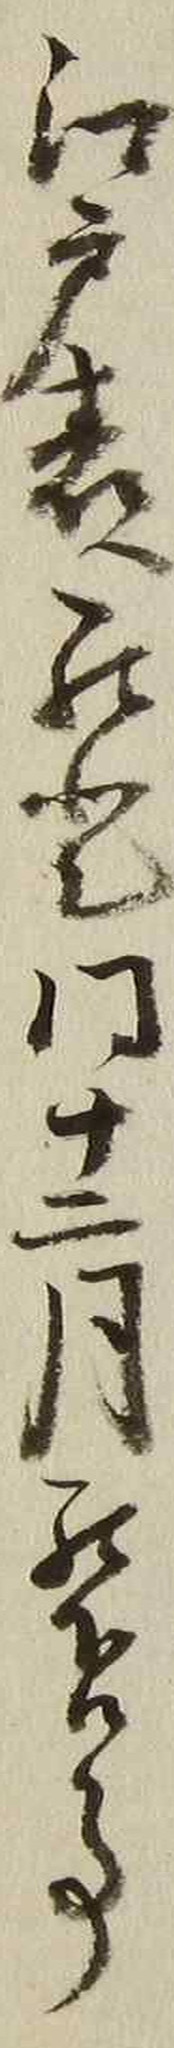江戸表へ罷登同十二月罷下候事
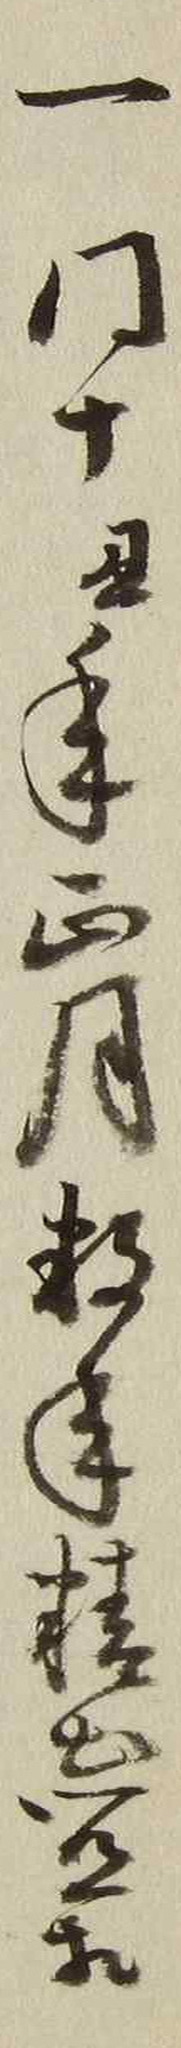一同十丑年正月数年精出宜相
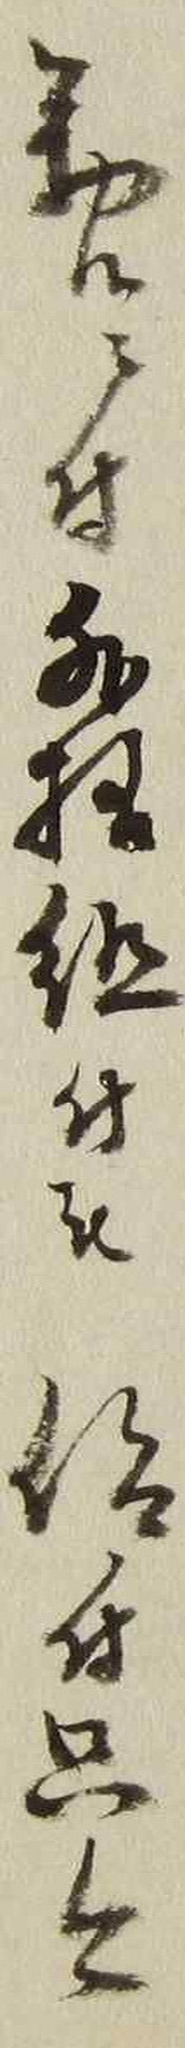勤候ニ付外様組付被仰付只今
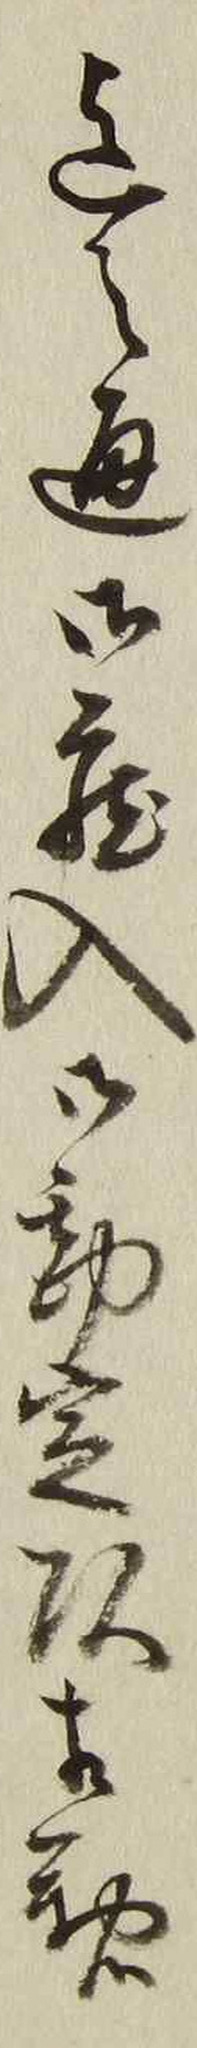迄之通御蔵入御勘定頭相勤候
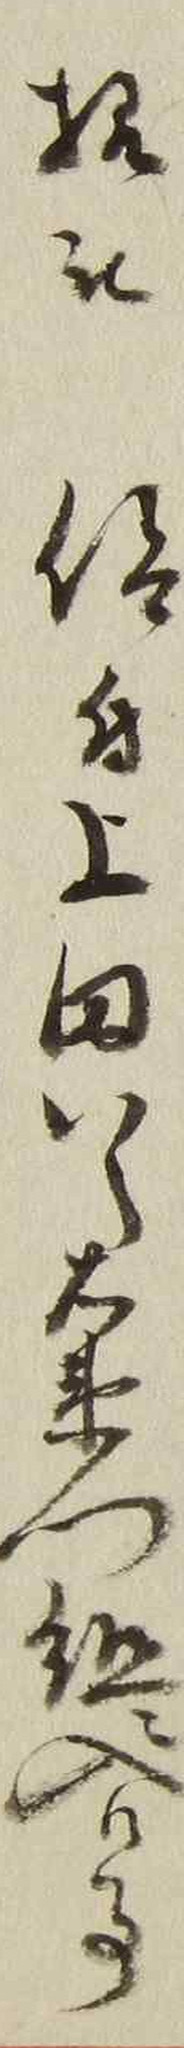様被仰付上田八郎右衛門組ニ入候事
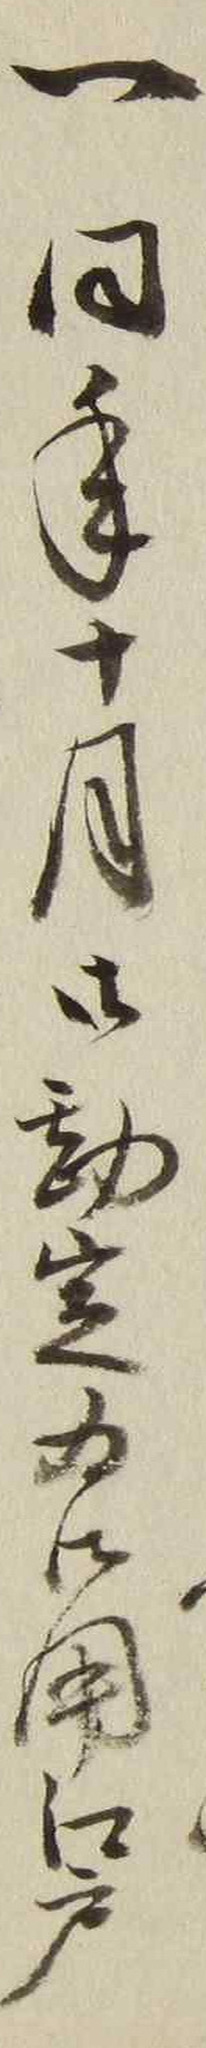一同年十月御勘定為御用江戸
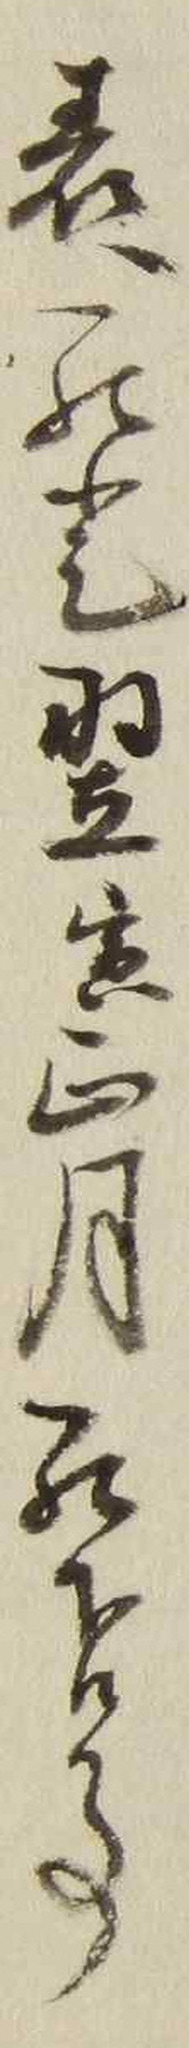表へ罷登翌午正月罷下候事

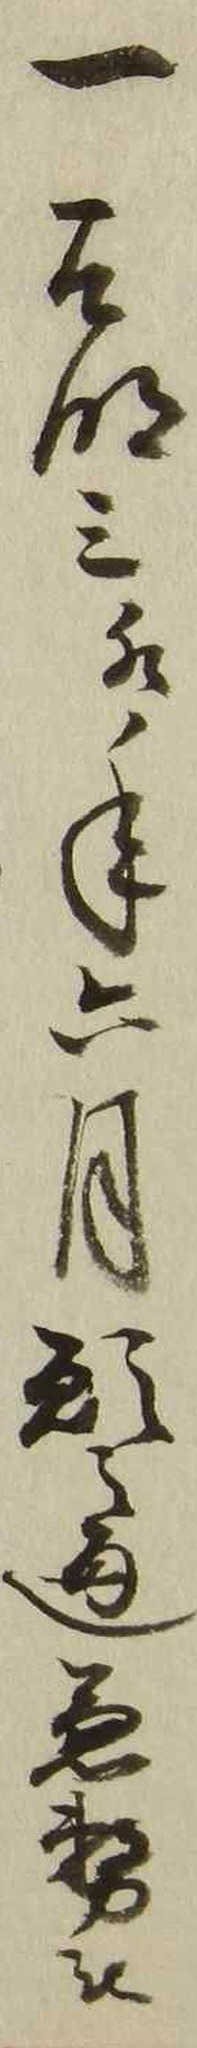一天明三卯年六月願之通兼務被
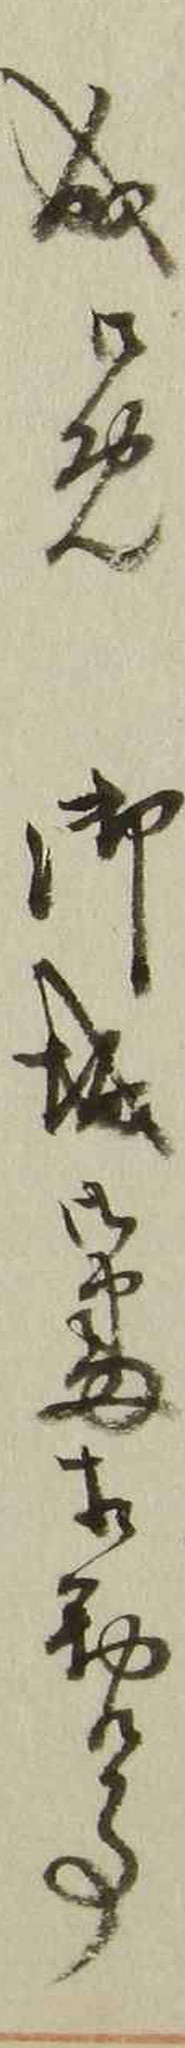成御免御城御番相勤候事
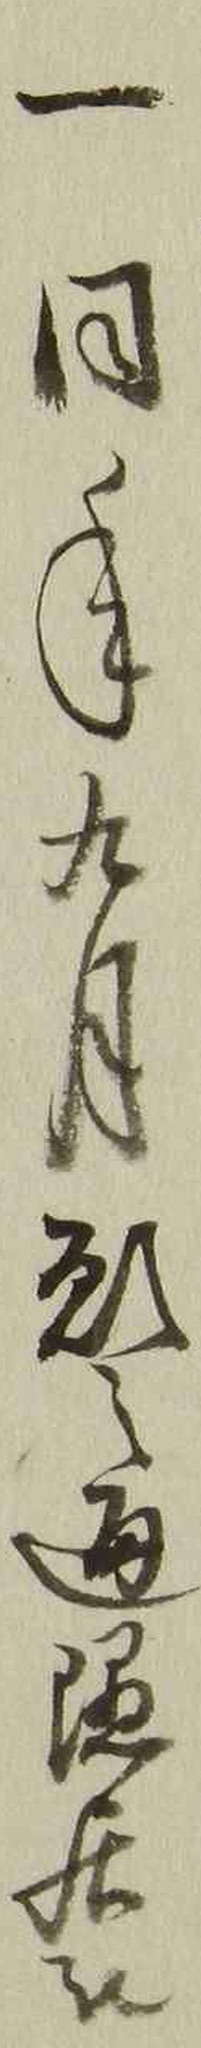一同年九月願之通隠居被
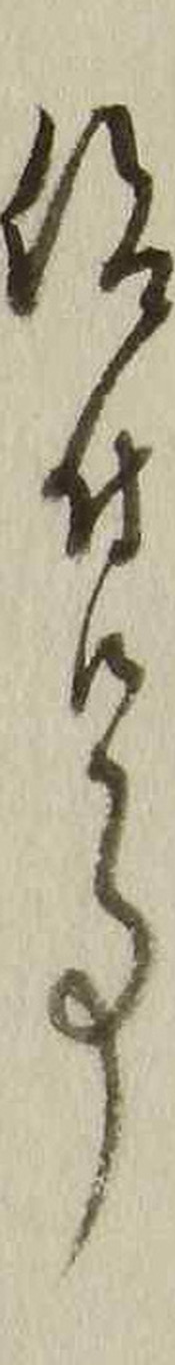仰付候事
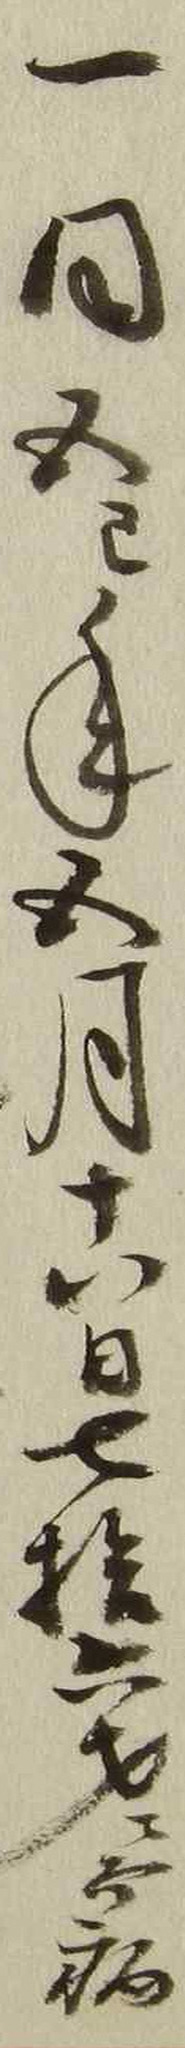一同五巳年五月十八日七拾六才ニ而病
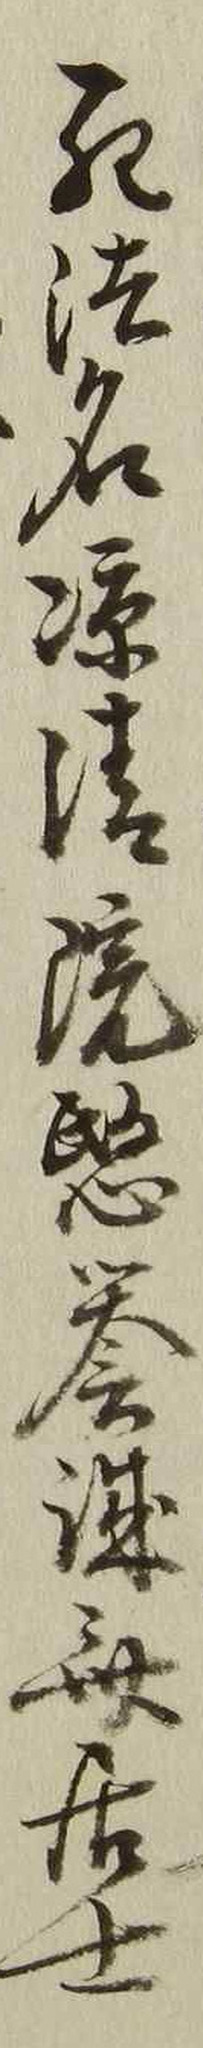死法名涼清院愍誉誠斉居士
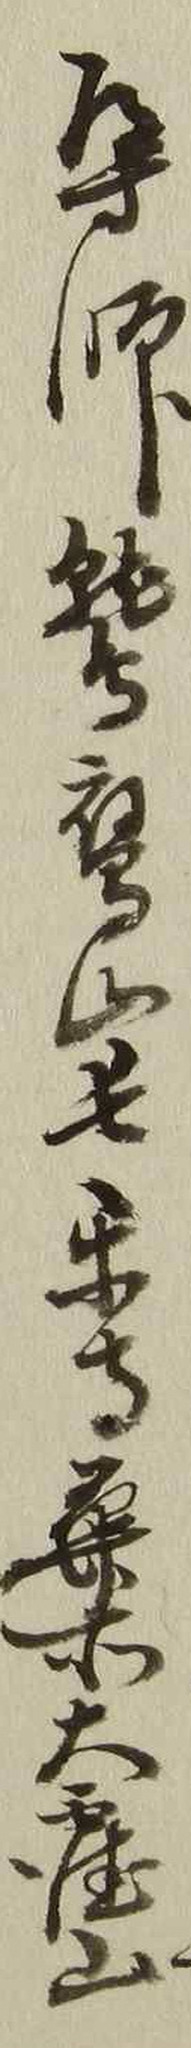導師鷲鷹山長楽寺葬所大窪山
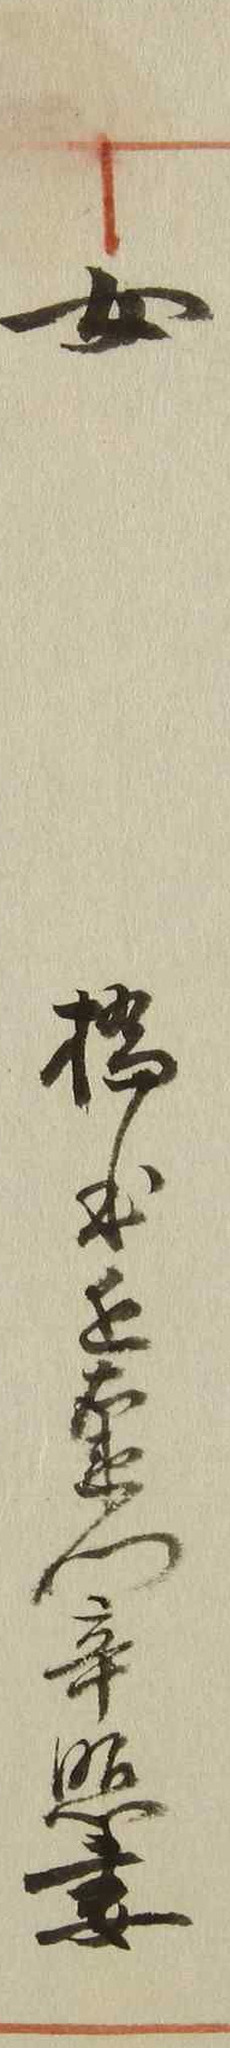女橋本近右衛門辛照妻
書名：諸士系譜　巻之53　に之部4
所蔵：会津若松市立会津図書館
